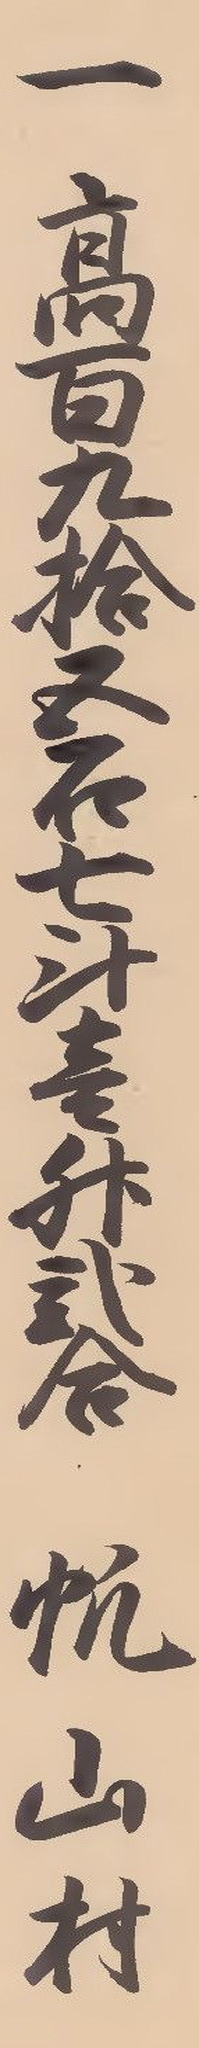一高百九拾五石七斗壱升弐合帆山村
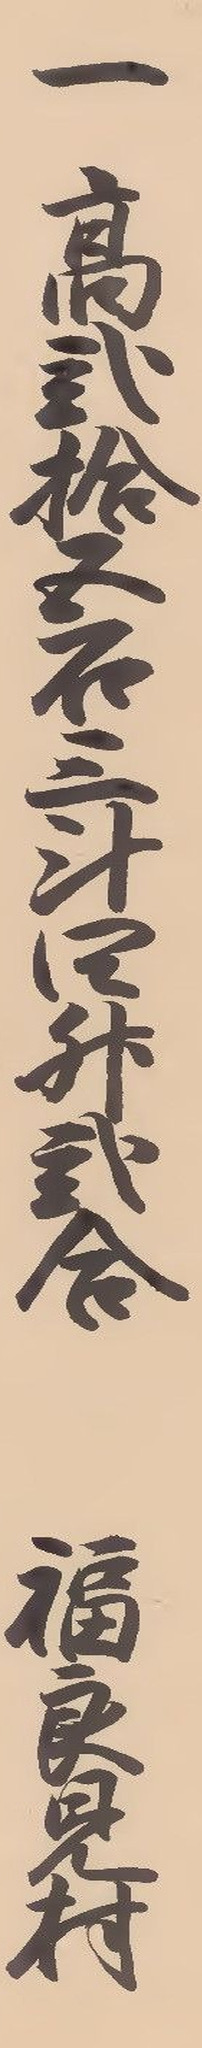一高弐拾五石三斗四升弐合福良見村
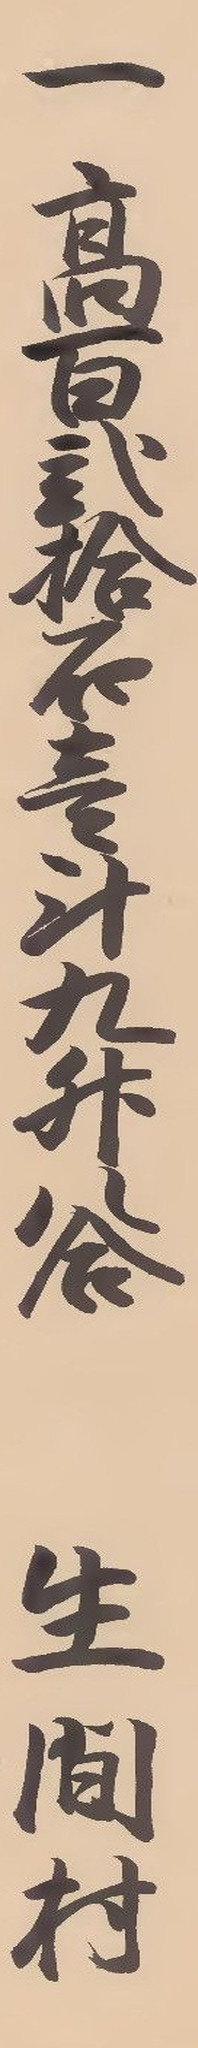一高百弐拾石壱斗九升八合生間村
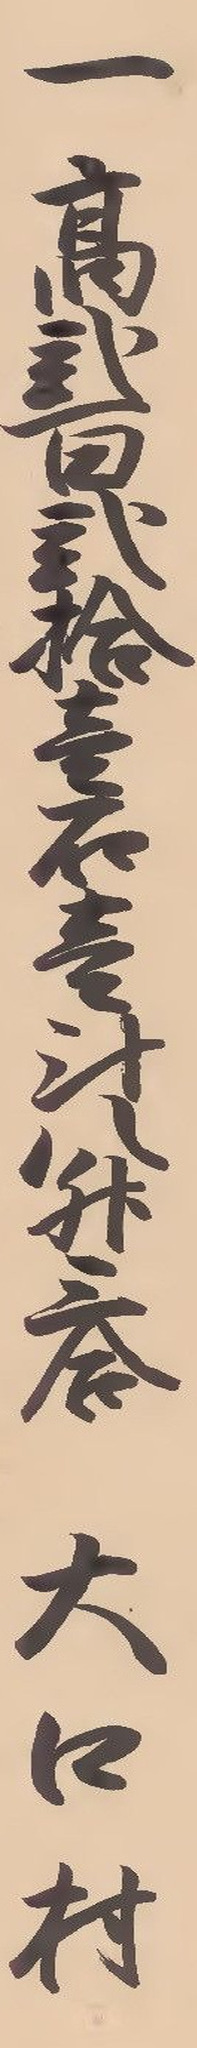一高弐百弐拾壱石壱斗八升三合大口村
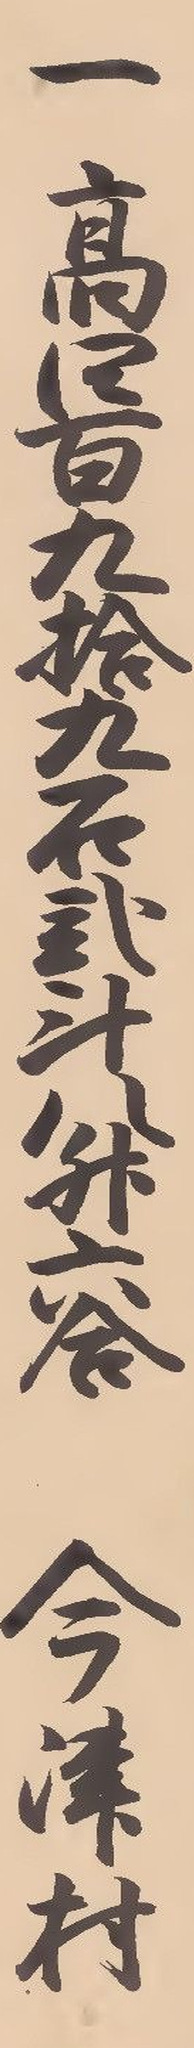一高四百九拾九石弐斗八升六合今津村
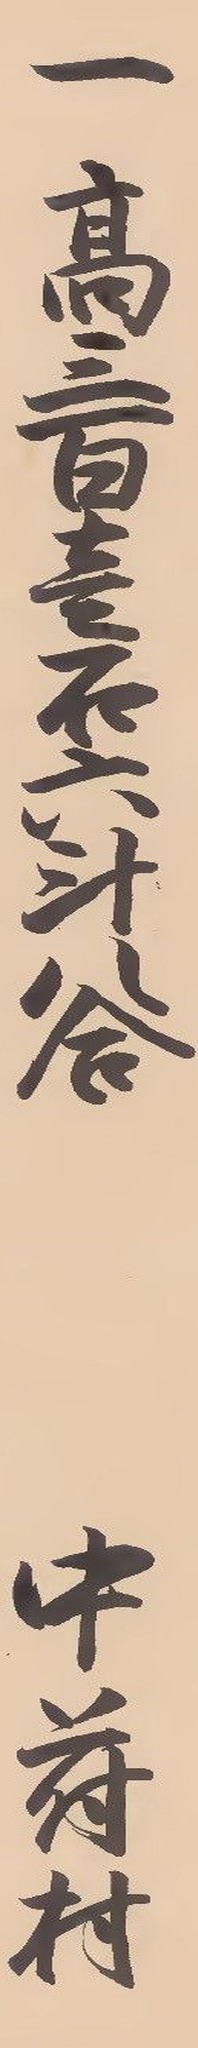一高三百壱石六斗八合中苻村
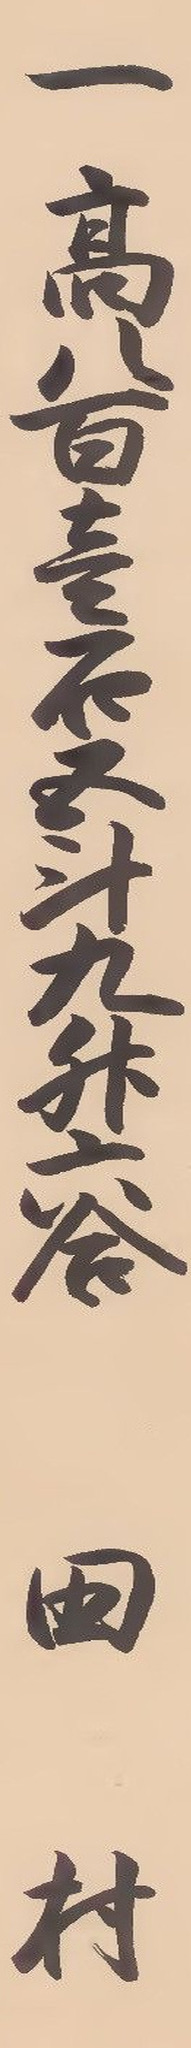一高八百壱石五斗九升六合田村

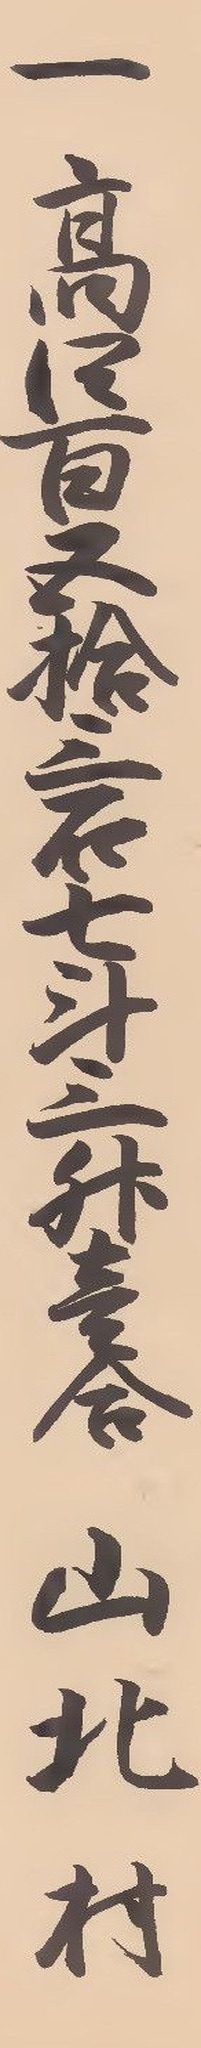一高四百五拾三石七斗三升壱合山北村
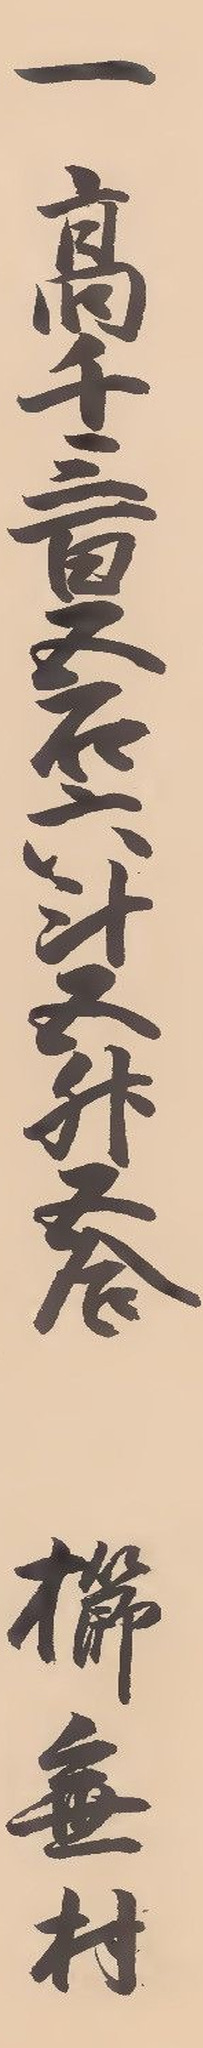一高千三百五石六斗五升五合櫛垂村
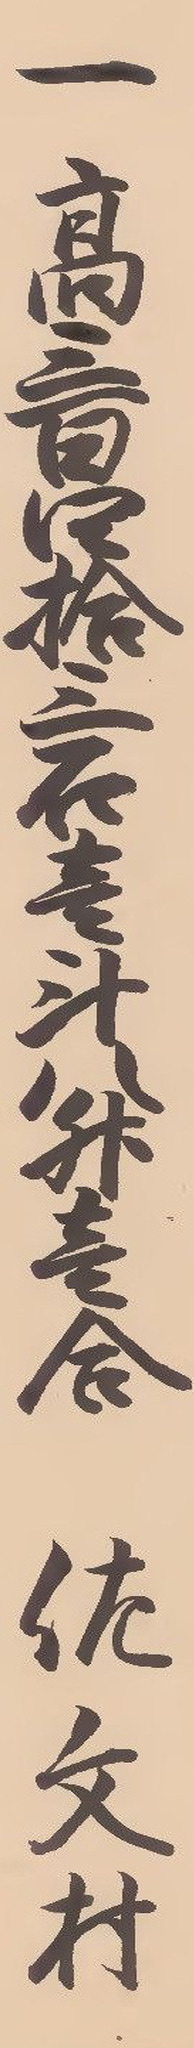一高三百四拾三石壱斗八升壱合佐文村
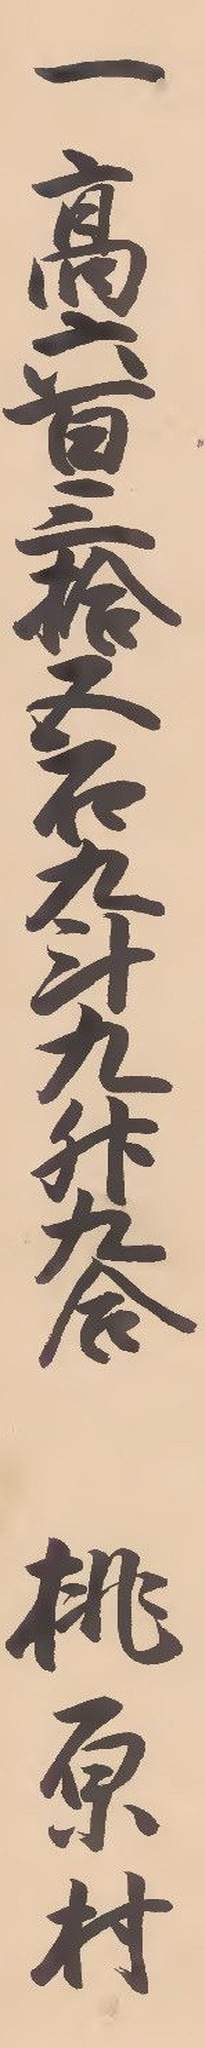一高六百三拾五石九斗九升九合桃原村
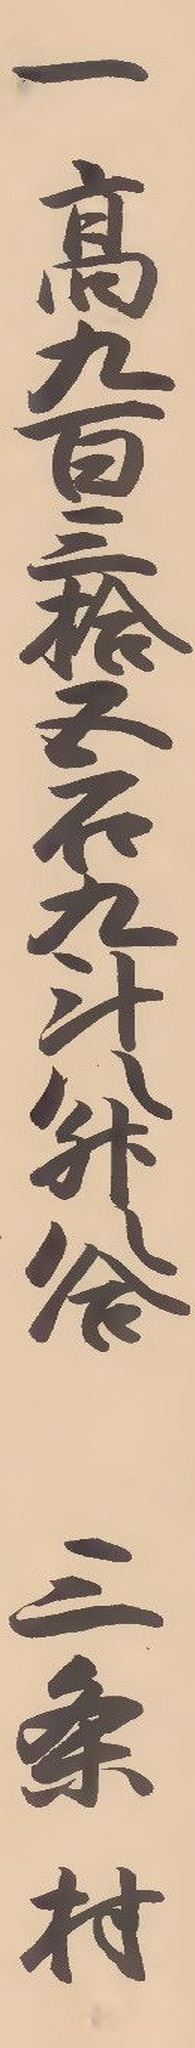一高九百三拾五石九斗八升八合三条村
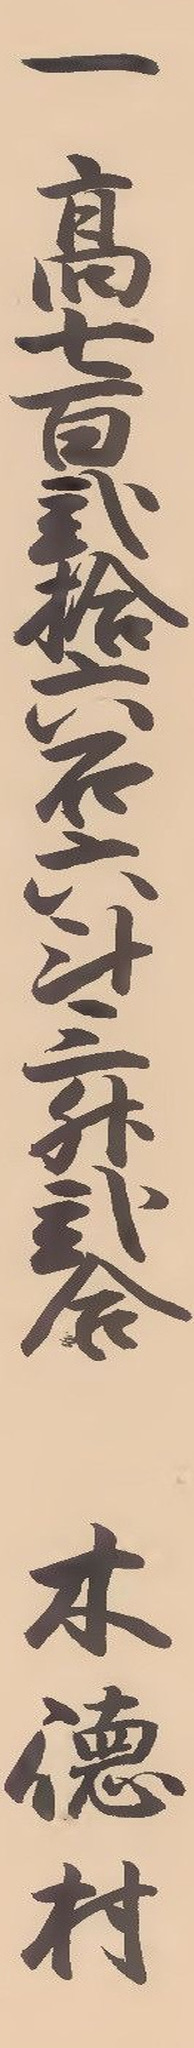一高七百弐拾六石六斗三升弐合木徳村
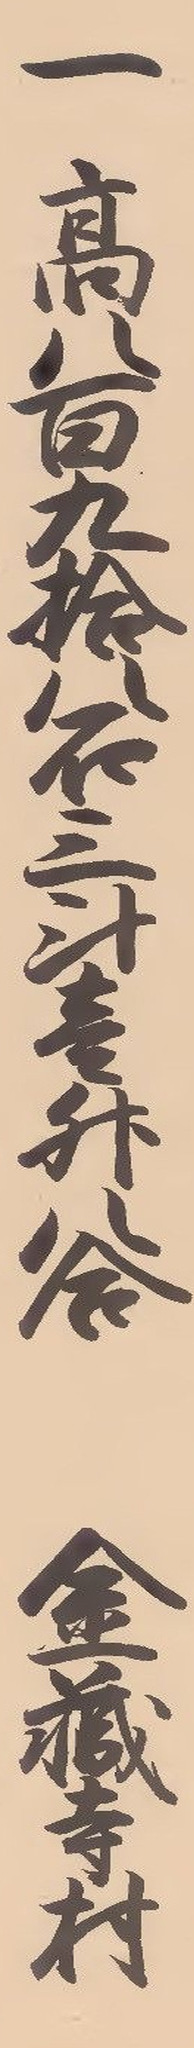一高八百九拾八石三斗壱升八合金蔵寺村
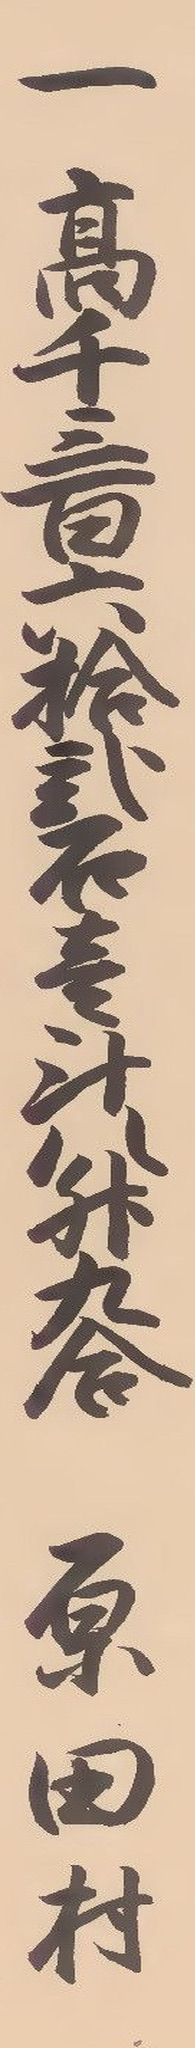一高千三百六拾弐石壱斗八升九合原田村

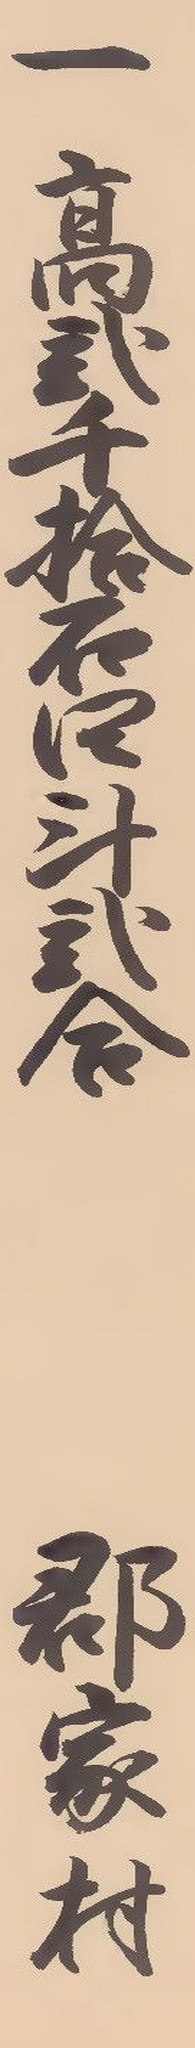一高弐千拾石四斗弐合郡家村
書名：讃岐国郷帳
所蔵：国立公文書館 National Archives of Japan
